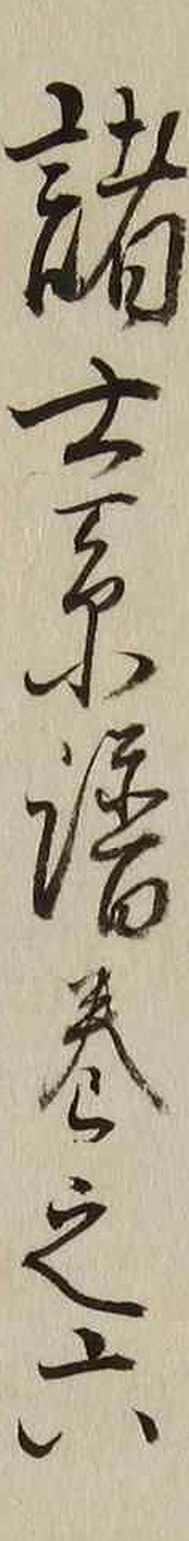諸士系譜巻之六
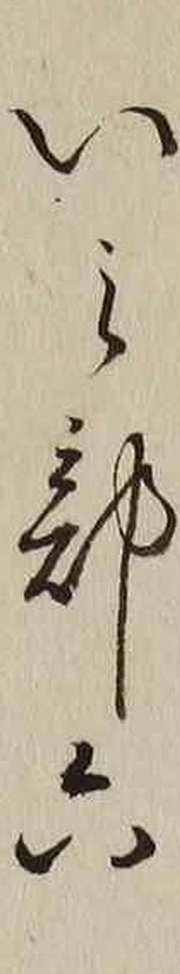い之部六
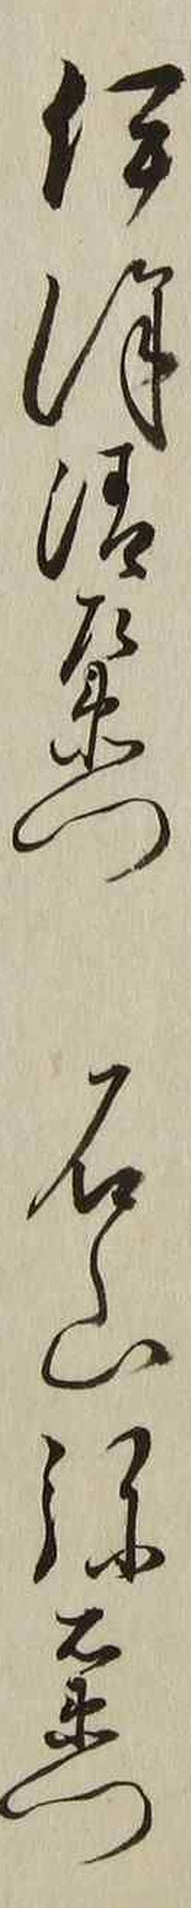伊沢清左衛門石山弥右衛門
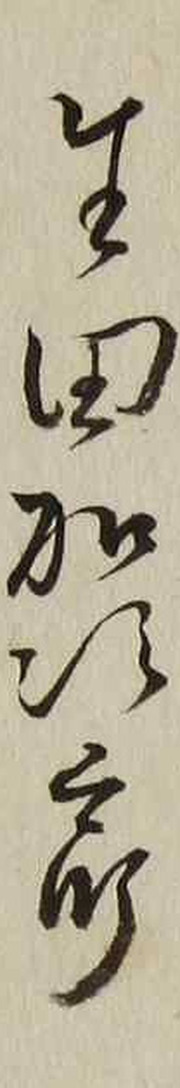生田加次郎

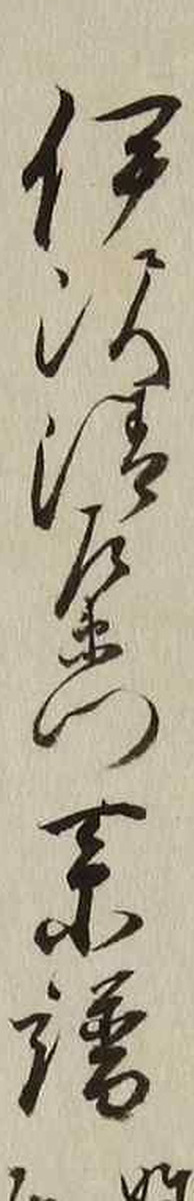伊沢清左衛門信喬
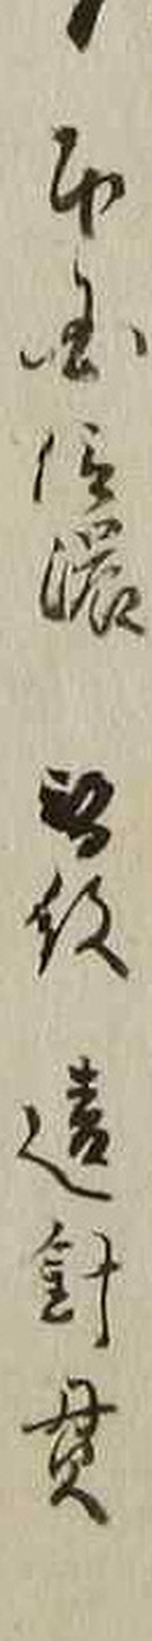本国信濃替紋違釘貫
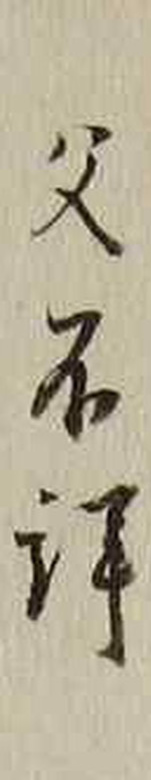父不詳
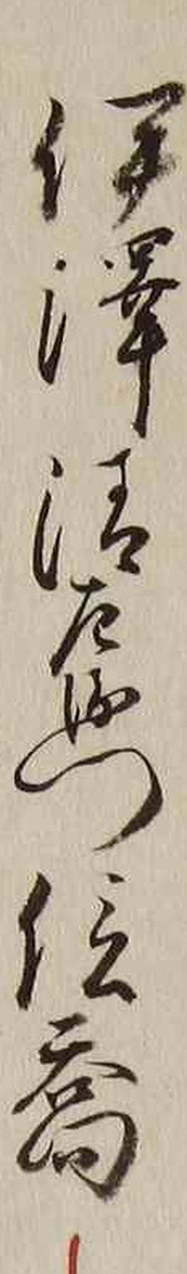伊沢清左衛門信喬
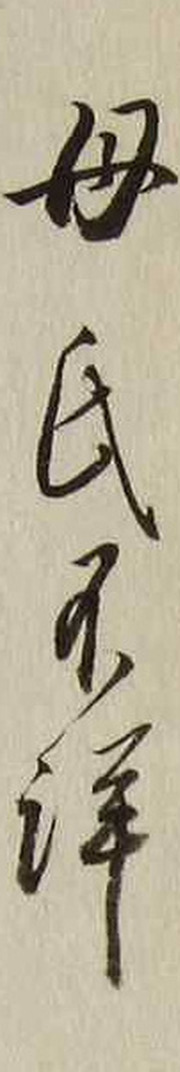母氏不詳
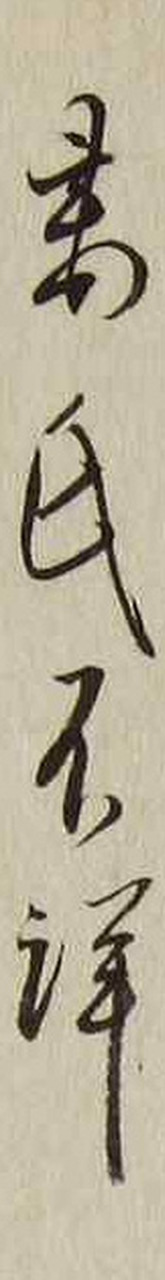妻氏不詳
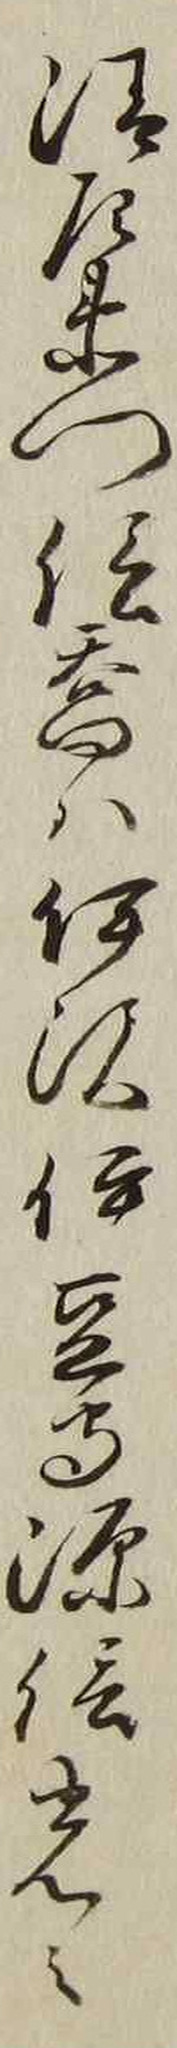清左衛門信喬は伊沢伊豆守源信光之
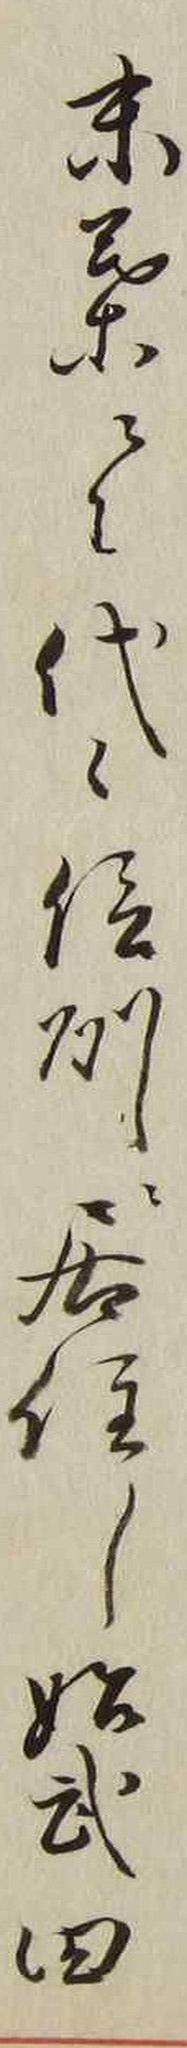末葉にて代々信州に居住し始武田
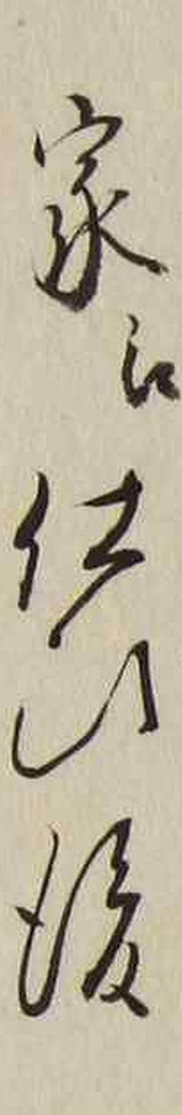家江仕候後

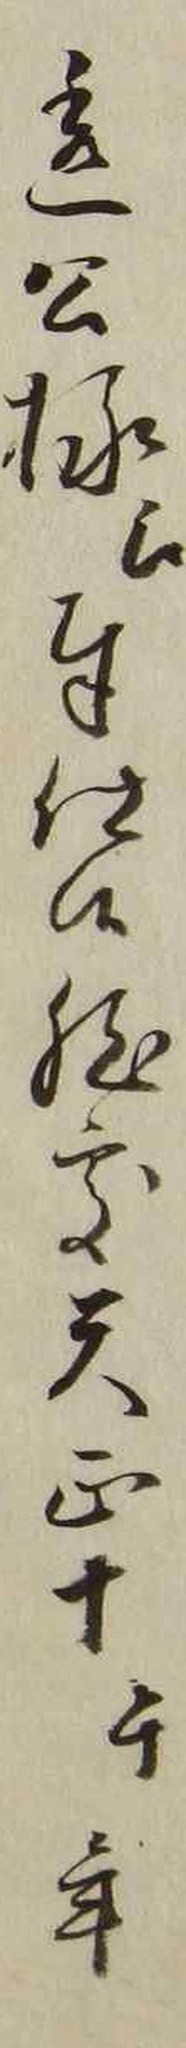透公様江奉仕候然處天正十午年
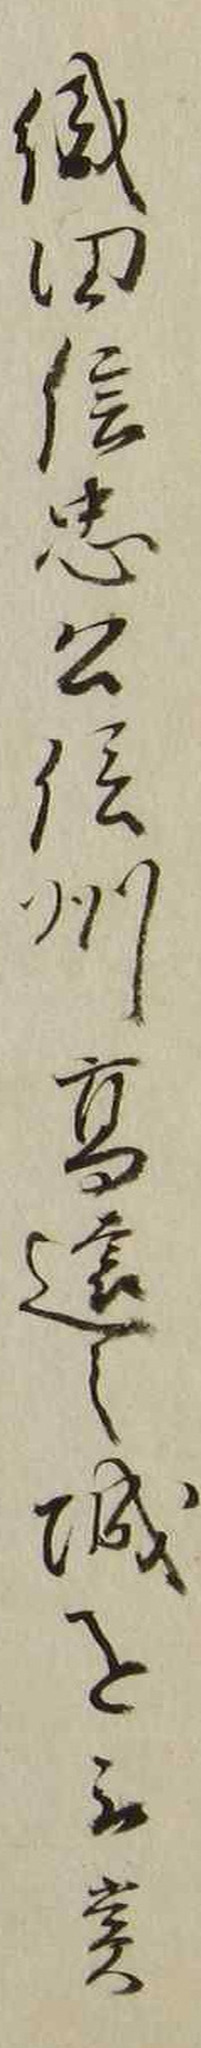織田信忠公信州高遠之城を被貫
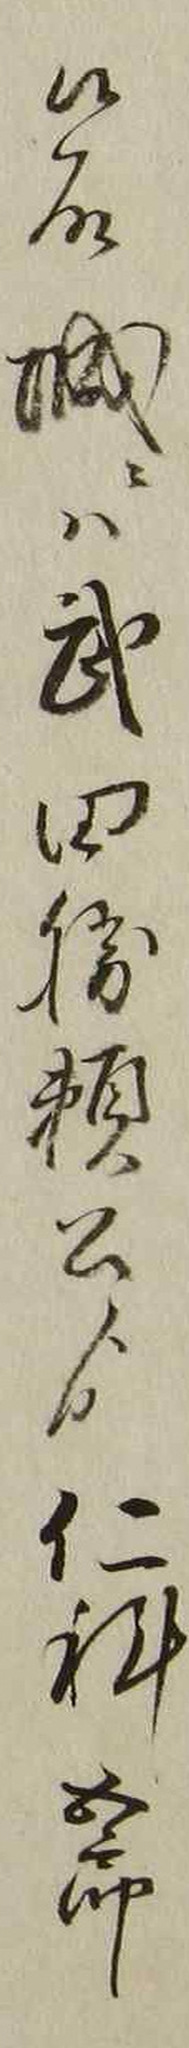候故城には武田勝頼公ゟ仁科五郎
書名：諸士系譜　巻之6　い之部6
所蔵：会津若松市立会津図書館
